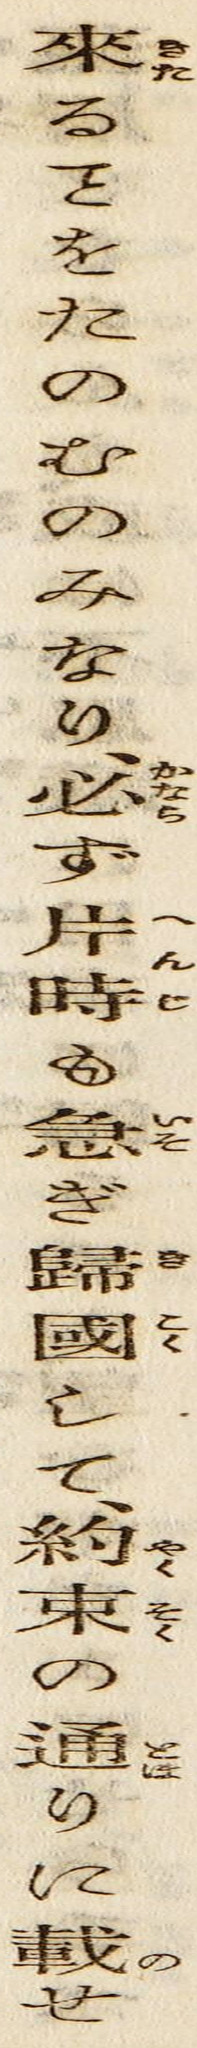来ることをたのむのみなり、必ず片時も急ぎ帰国して、約束の通りに載せ
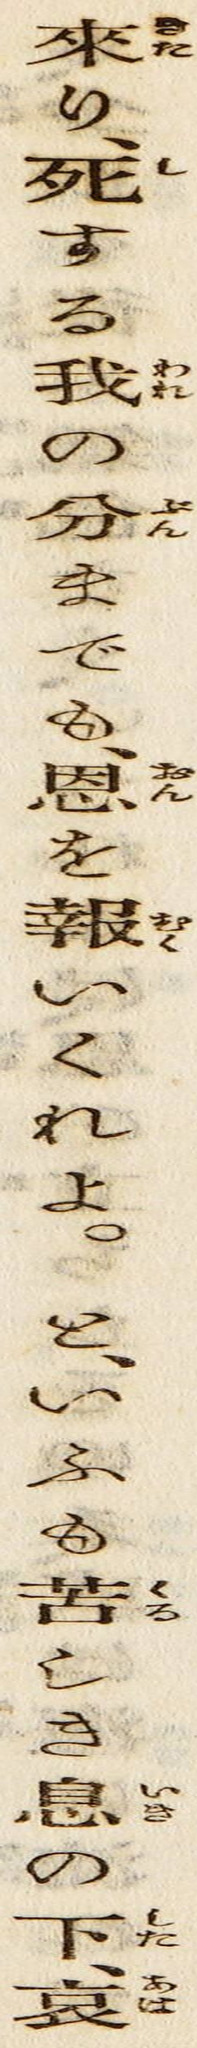来り、死する我の分までも、恩を報いくれよ。と、いふも苦しき息の下、哀
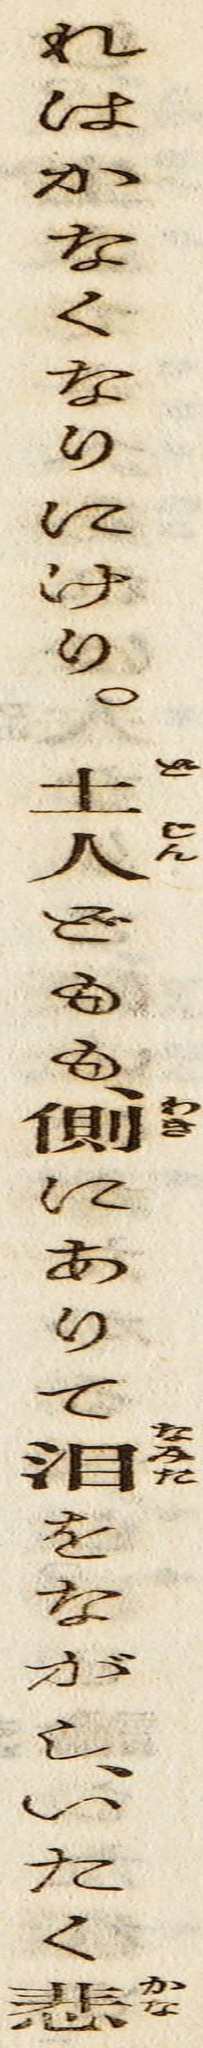れはかなくなりにけり。土人どもも、側にありて泪をながし、いたく悲
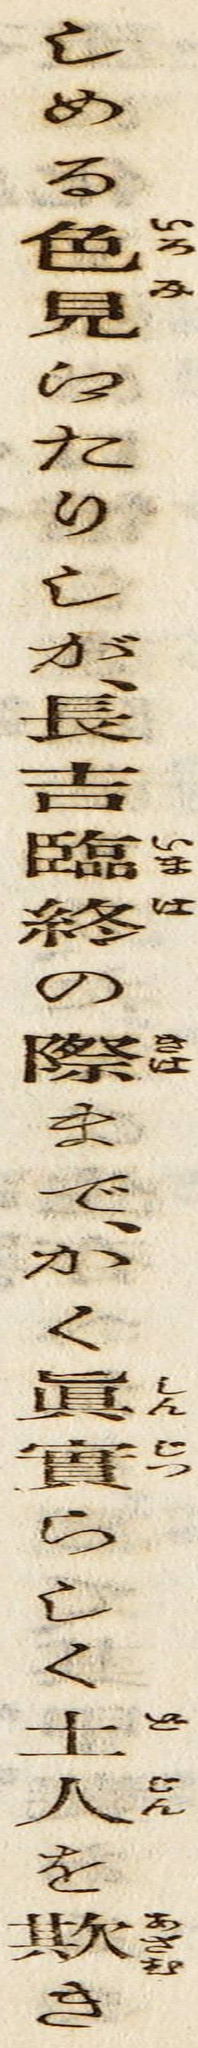しめる色見えたりしが、長吉臨終の際まで、かく真実らしく土人を欺き
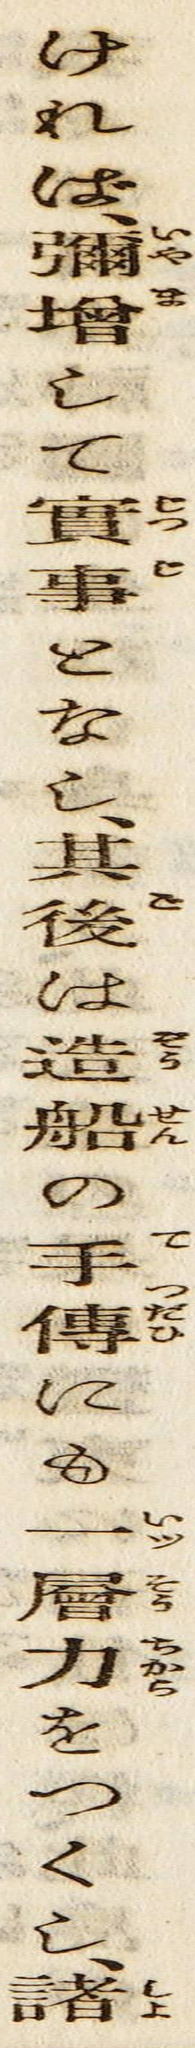ければ、弥増して実事となし、其後は造船の手伝にも一層力をつくし、諸
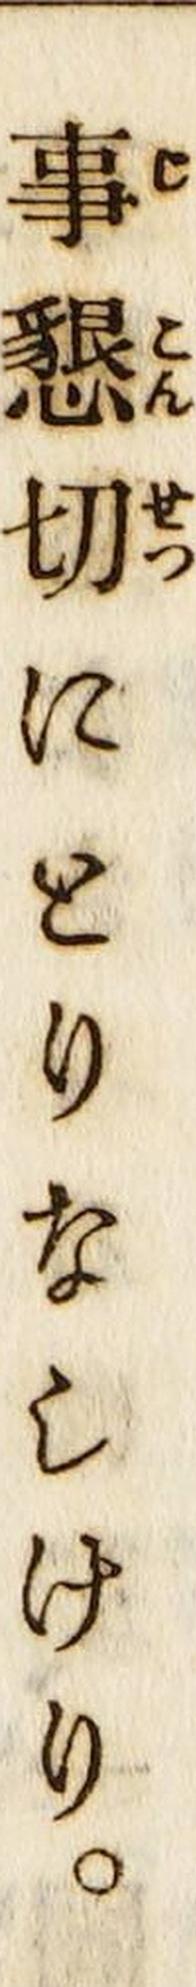事懇切にとりなしけり。
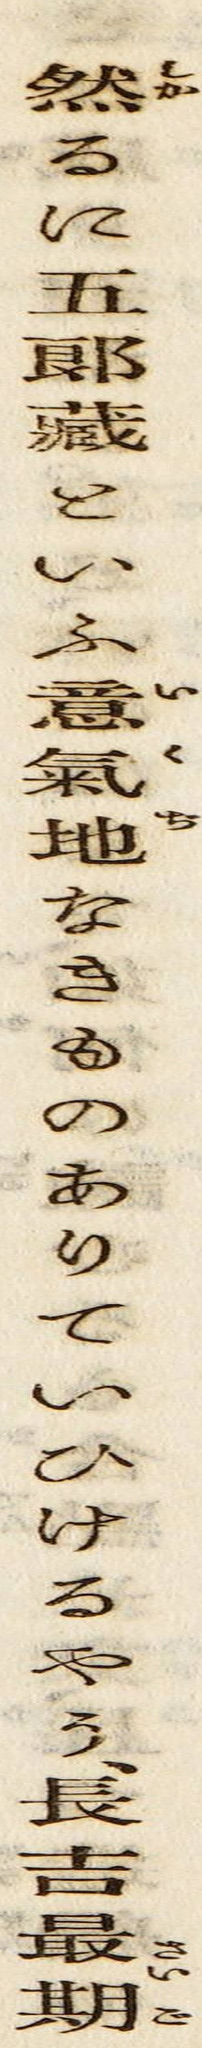然るに五郎蔵といふ意気地なきものありていひけるやう、長吉最期
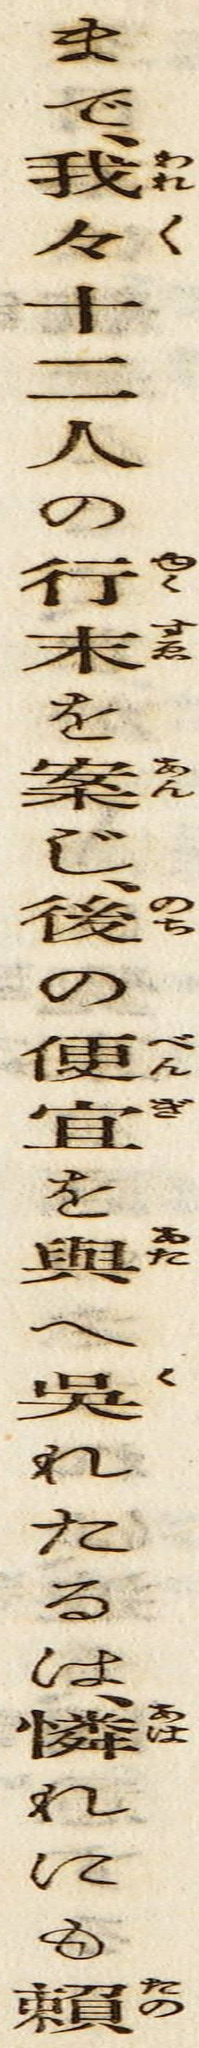まで、我々十二人の行末を案じ、後の便宜を与へ呉れたるは、憐れにも頼
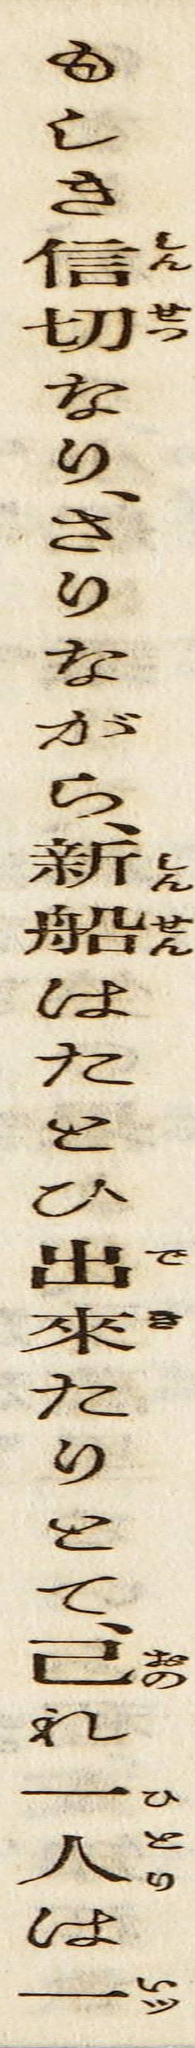もしき信切なり、さりながら、新船はたとひ出来たりとて、己れ一人は一
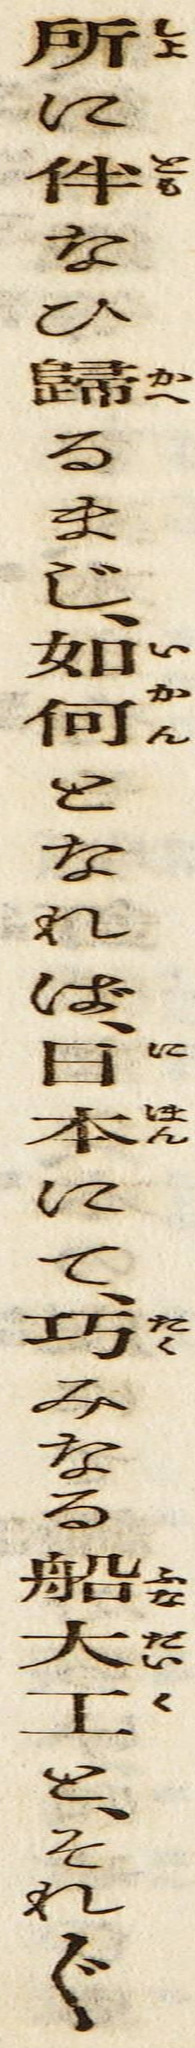所に伴なひ帰るまじ、如何となれば、日本にて、巧みなる船大工と、それ〴〵
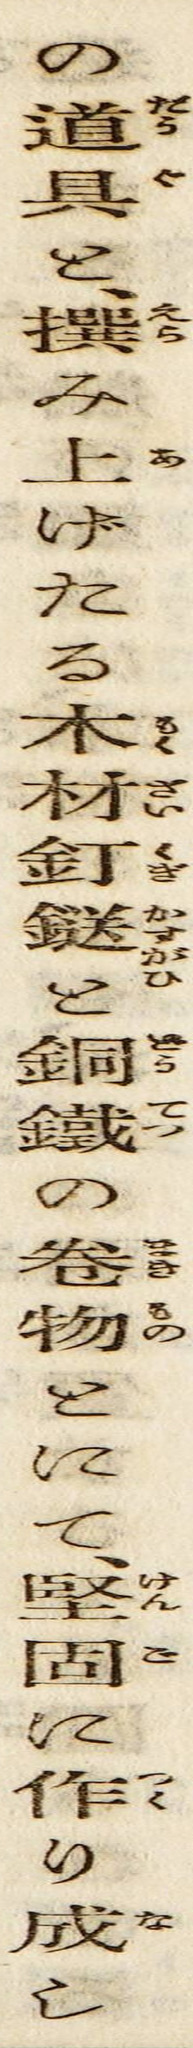の道具と、撰み上げたる木材釘鎹と銅鉄の巻物とにて、堅固に作り成し
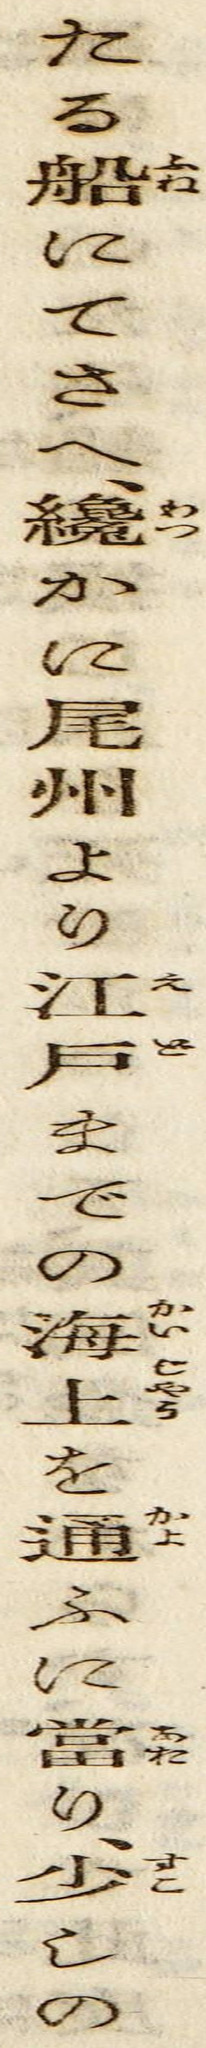たる船にてさへ、纔かに尾州より江戸までの海上を通ふに当り、少しの

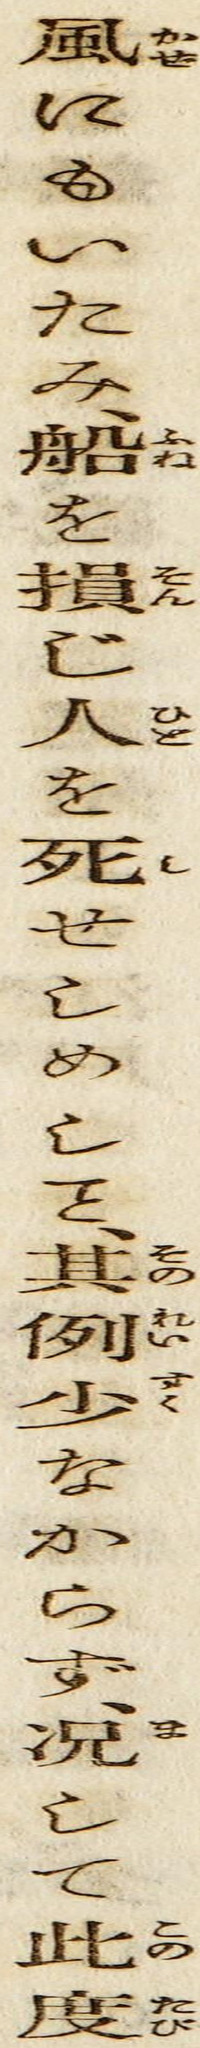風にもいたみ、船を損じ人を死せしめしこと、其例少なからず、況して此度
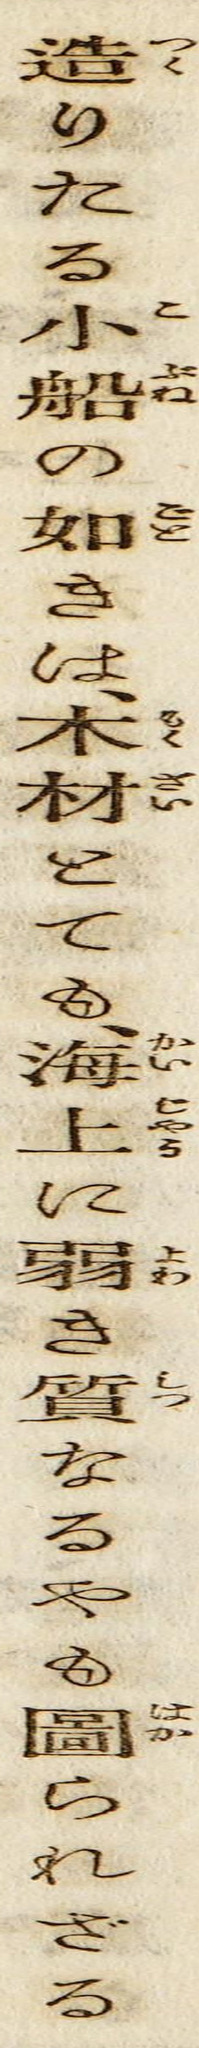造りたる小船の如きは、木材とても、海上に弱き質なるやも図られざる
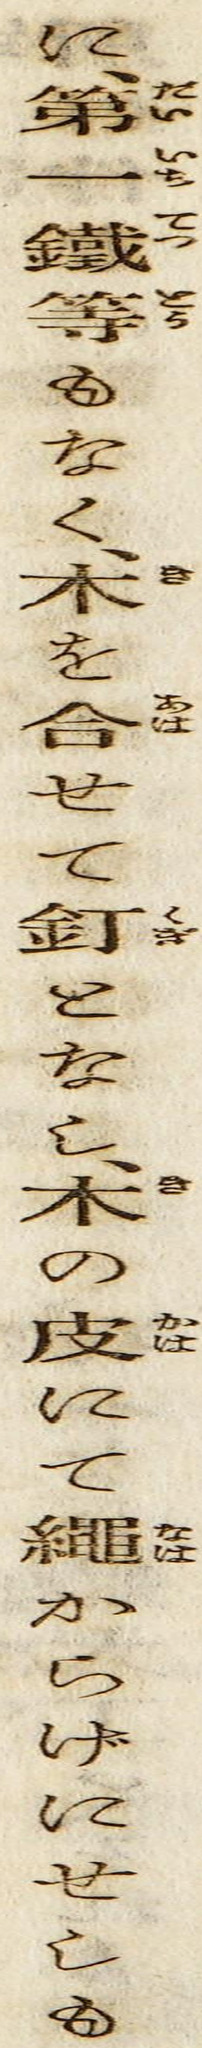に、第一鉄等もなく、木を合せて釘となし、木の皮にて縄からげにせしも
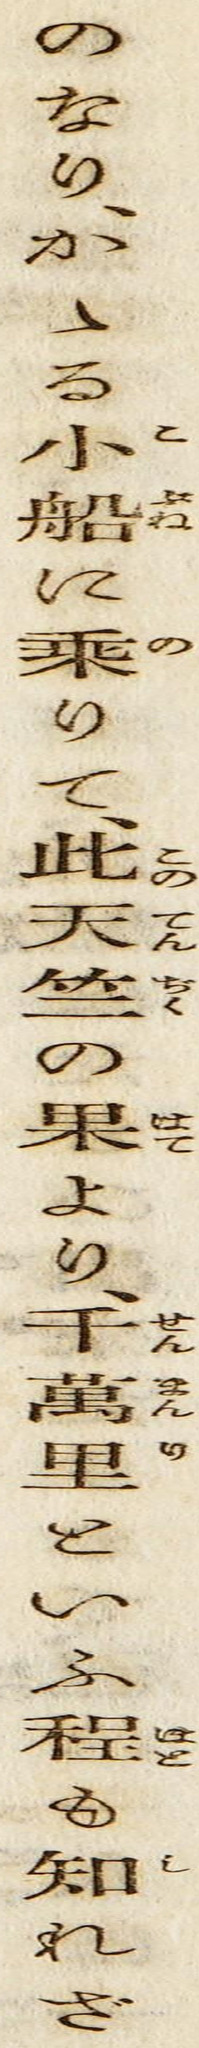のなり、かゝる小船に乗りて、此天竺の果より、千万里といふ程も知れざ
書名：日本漂流譚
